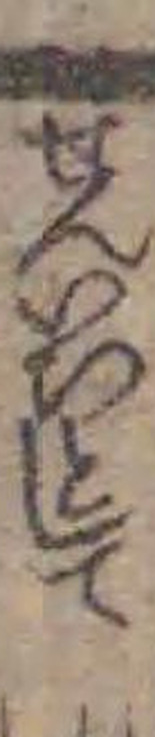せんいちとして
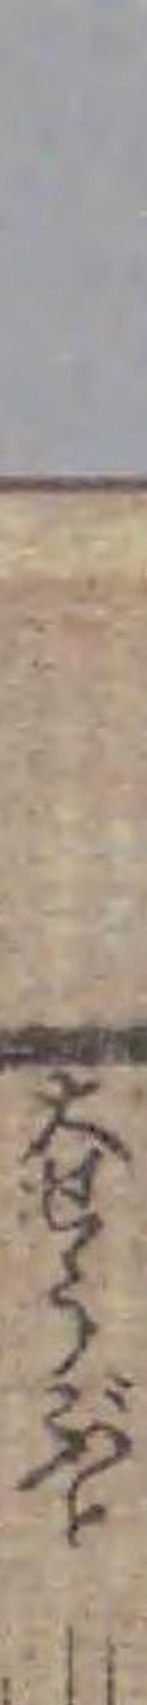大せうぶと
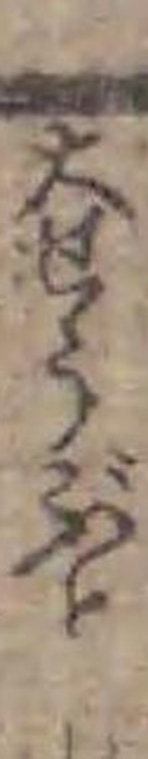大せうぶと
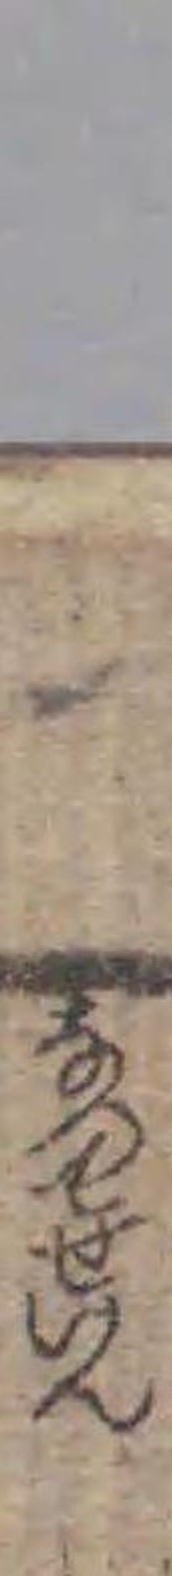なつてせけん
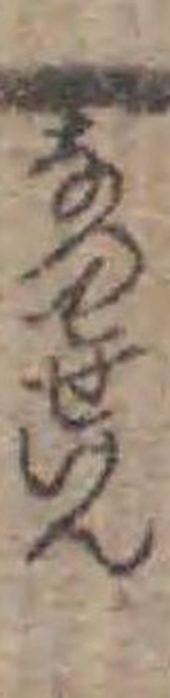なつてせけん
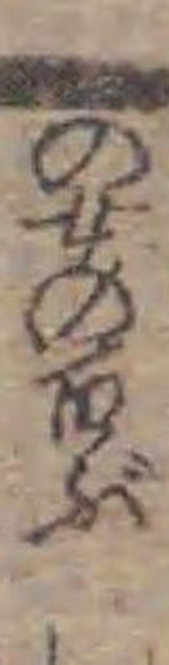の女の百ぶ
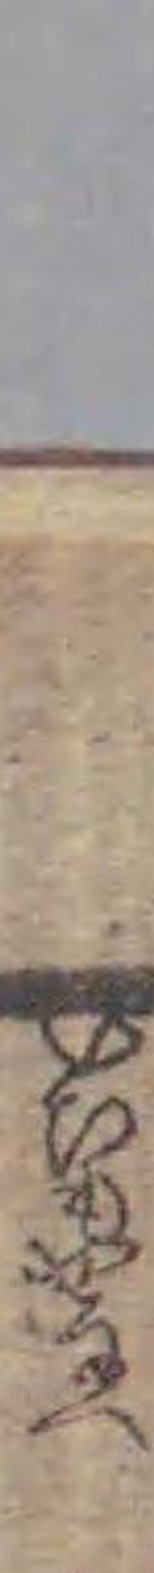いちもかなへ
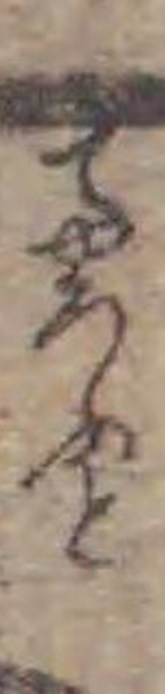てやろふと
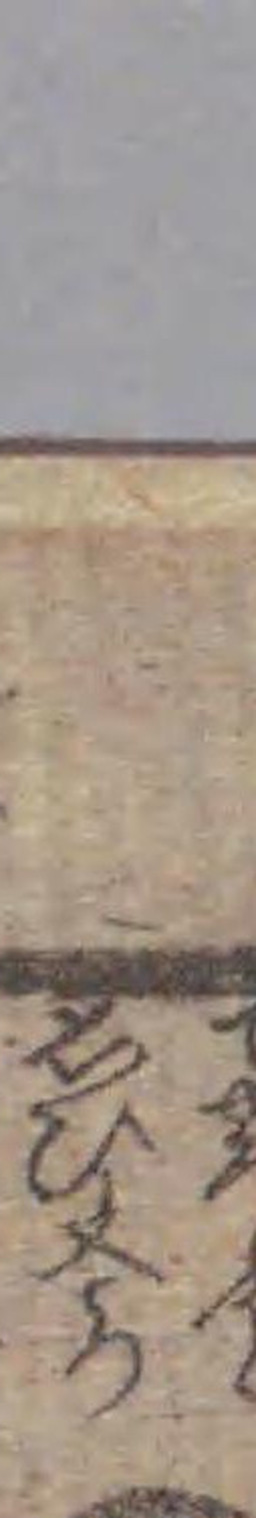思ひ又ぞろ
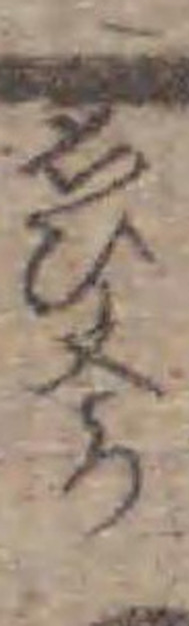思ひ又ぞろ
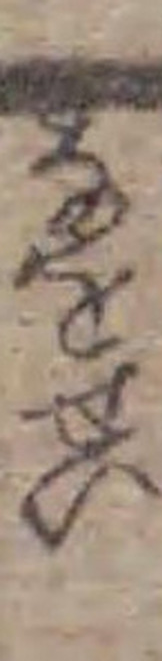なをせい
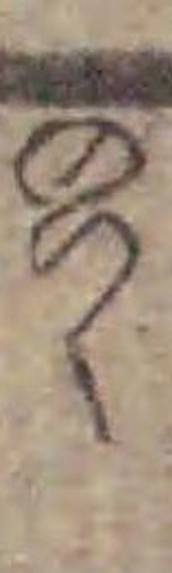のつく
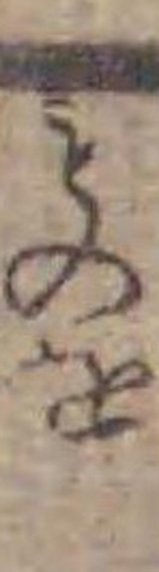ものを
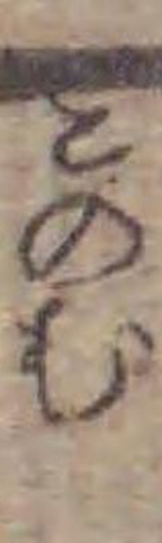このむ

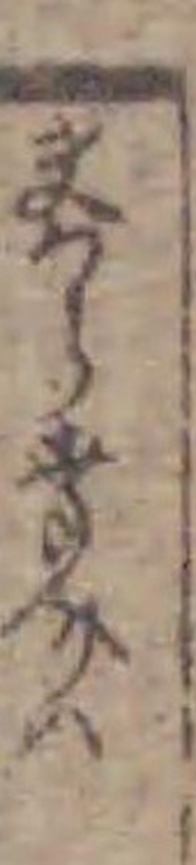夫から幸介は
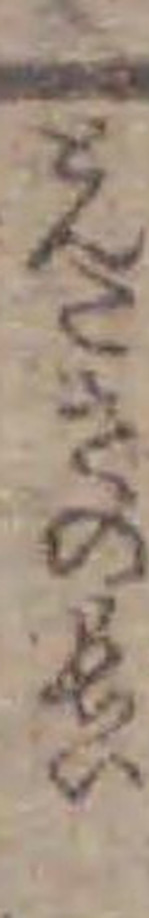とんたきの長い
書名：通風伊勢物語 : 3巻
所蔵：国立国会図書館 National Diet Library, JAPAN
